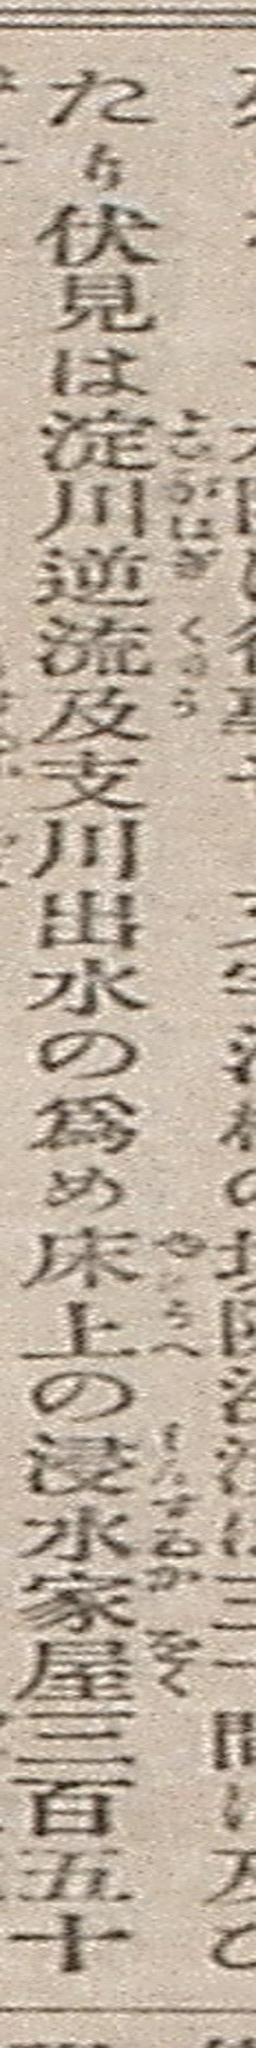たり伏見は淀川逆流及支川出水の為め床上の浸水家屋三百五十
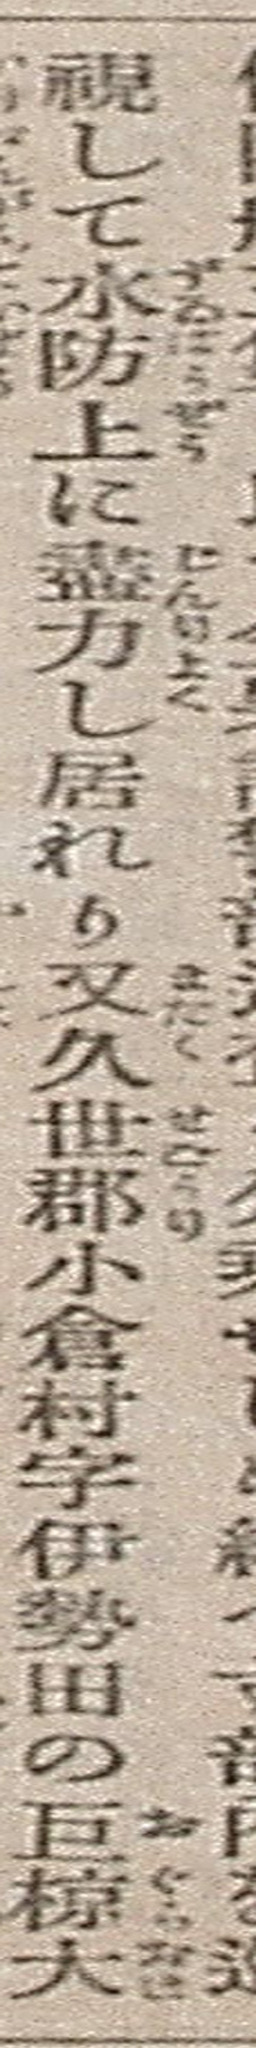視して水防上に尽力し居れり又久世郡小倉村字伊勢田のく巨椋大
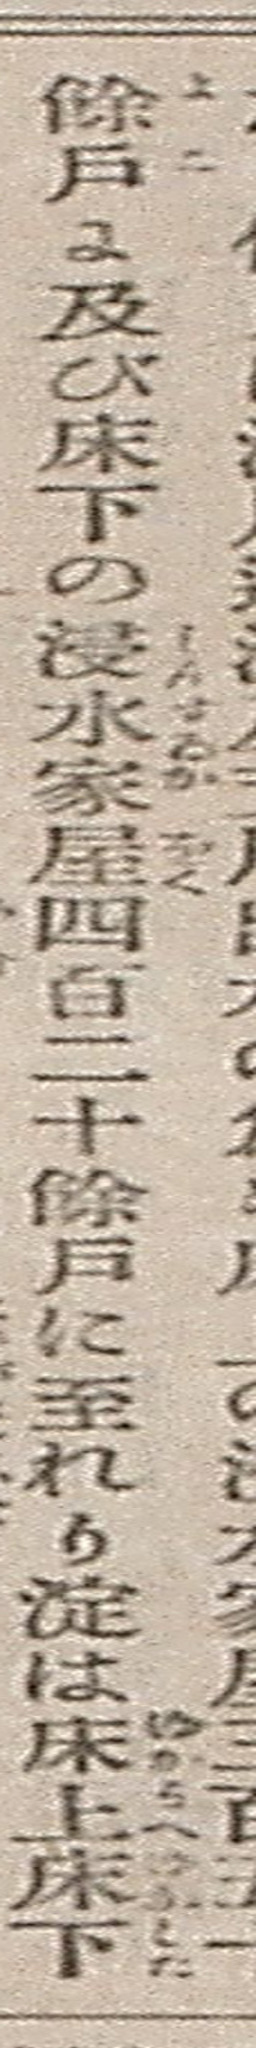餘戸に及び床下の浸水家屋四百二十餘戸に至れり淀は床上床下
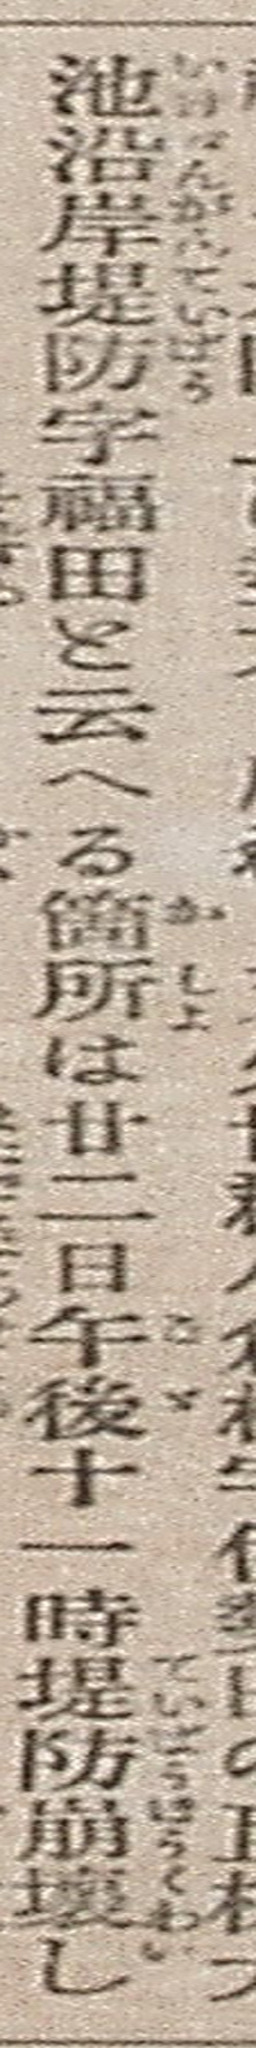池沿岸堤防字福田と云へる箇所は廿二日午後十一時堤防崩壊し
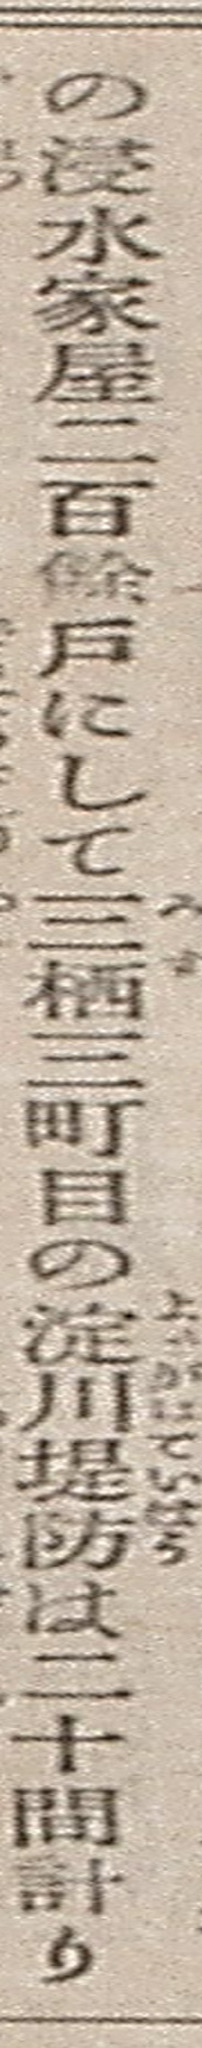の浸水家屋二百餘戸にして三栖三町目の淀川堤防は二十間計り
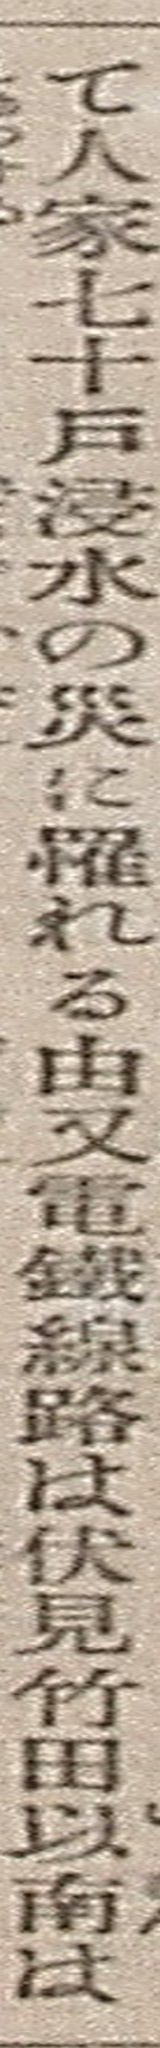て人家七十戸浸水の災に罹れる由又電鉄線路は伏見竹田以南は
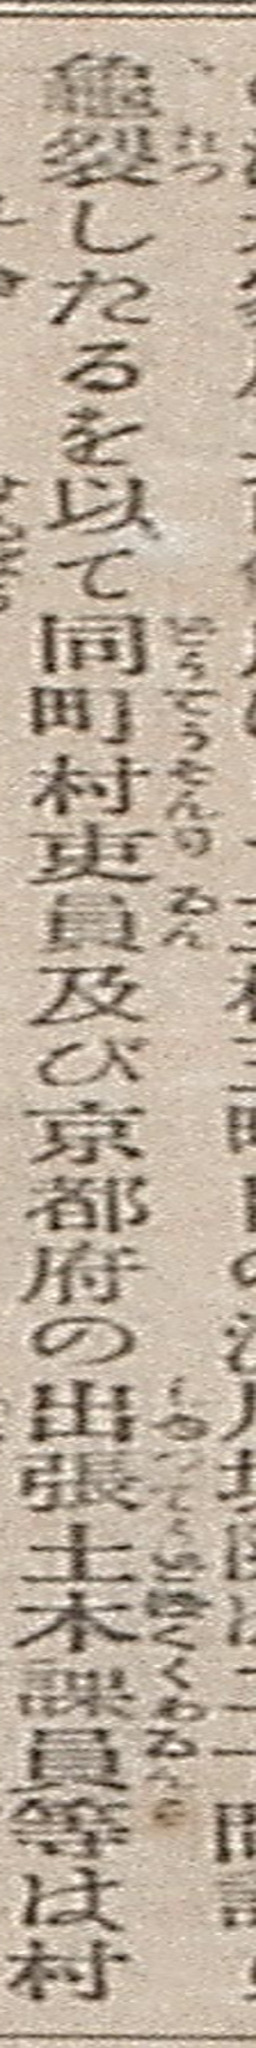亀裂したるを以て同町村吏員及び京都府の出張土木課員等は村
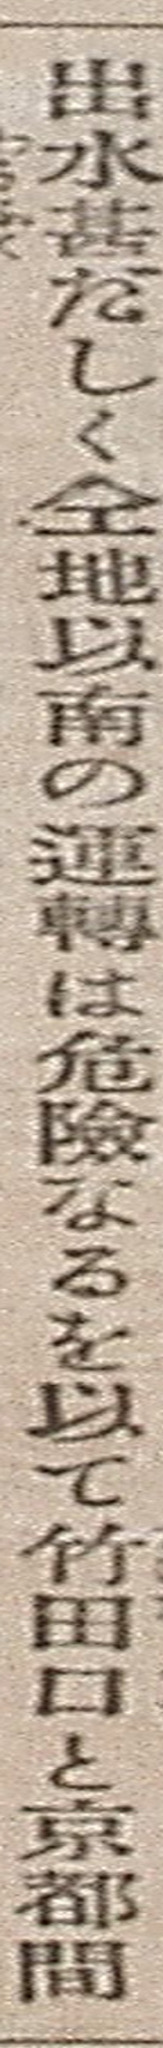出水甚だしく同地以南の運転は危険なるを以て竹田口と京都間
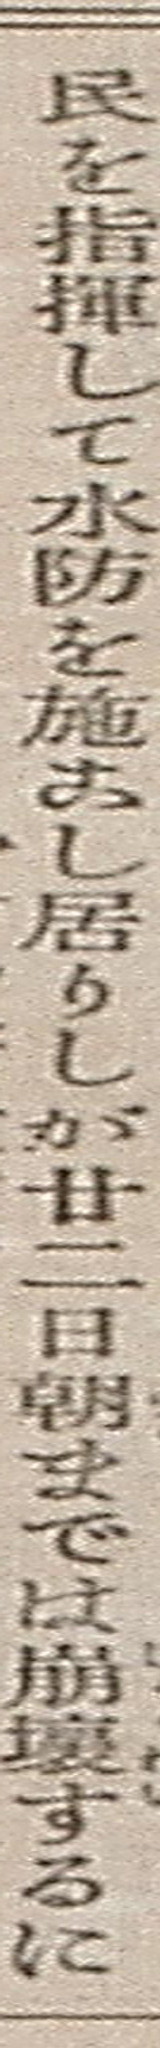民を指揮して水防を施こし居りしが廿二日朝までは崩壊するに
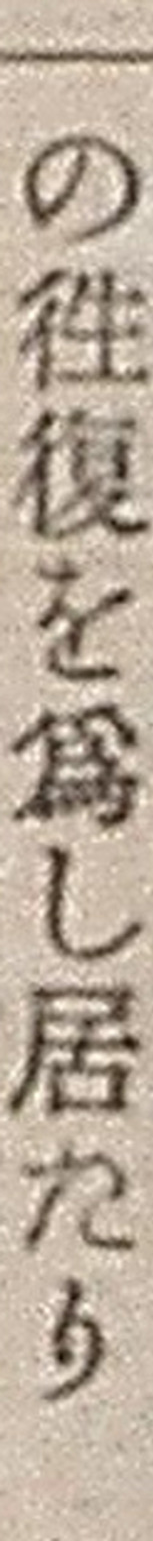の往復を為し居たり
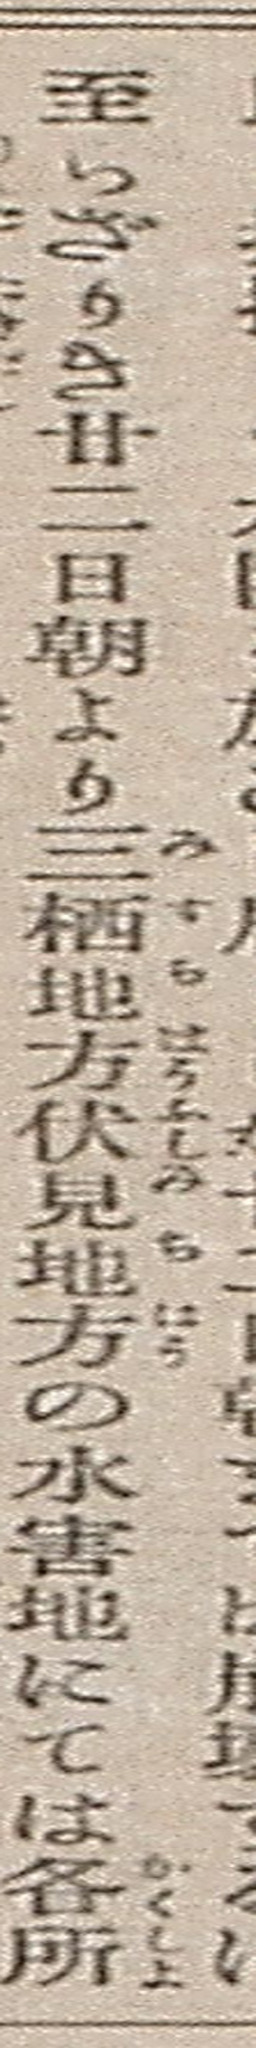至らざりき廿二日朝より三栖地方伏見地方の水害地にては各所
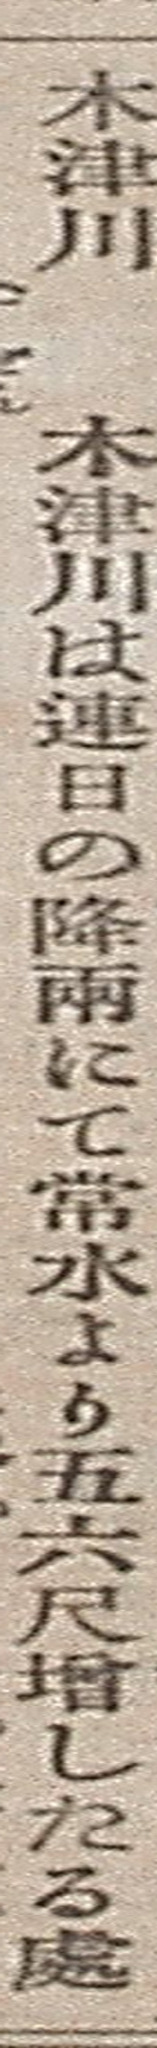木津川来津川は連日の降雨にて常水より五六尺増したる処
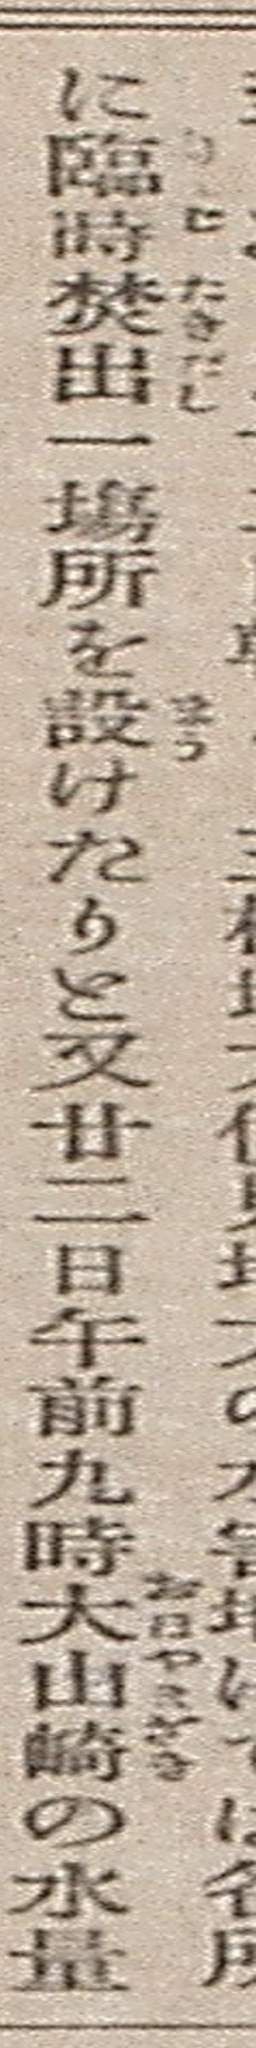に臨時焚出一場所を設けたりと又廿二日午前九時大山崎の水量
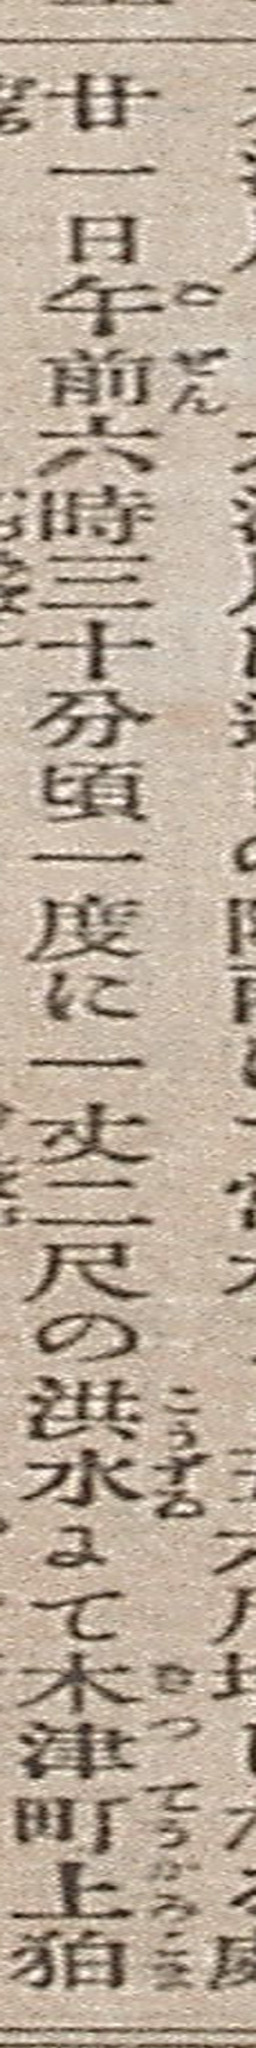廿一日午前六時三十分頃一度に一丈二尺の洪水にて木津長上狛
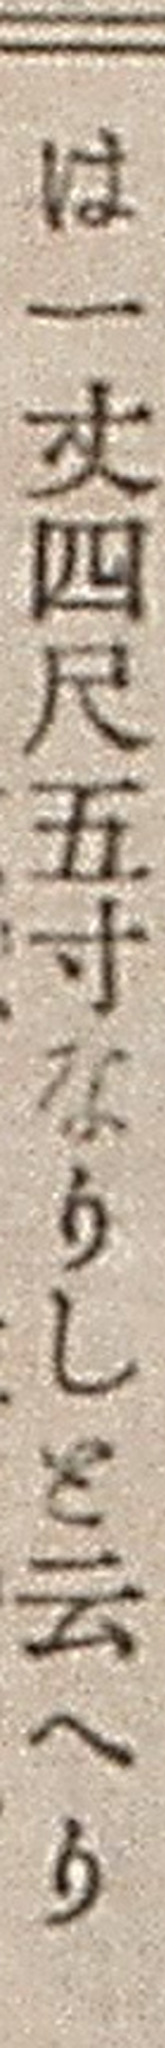は一丈四尺五寸なりしと云へり
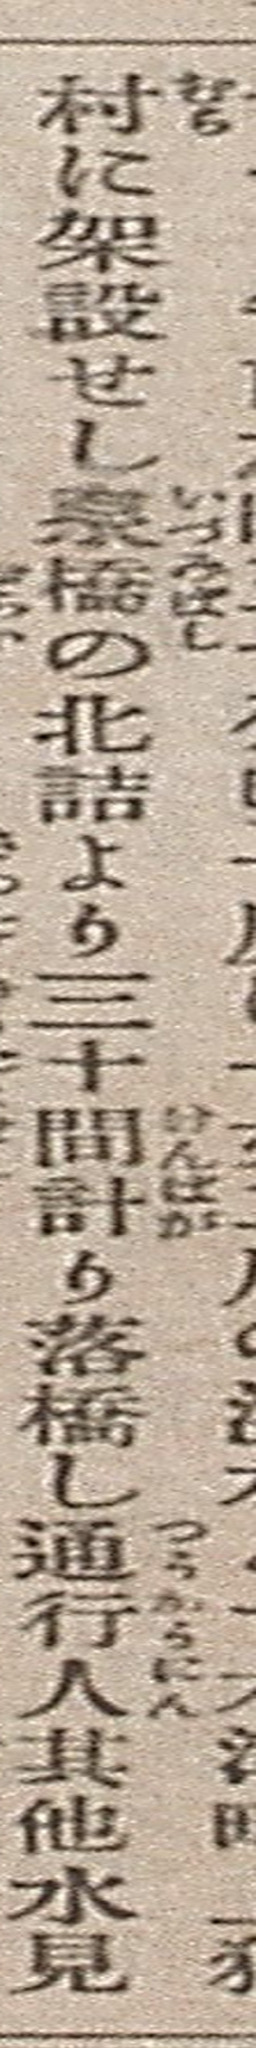村に架設せし泉橋の北詰より三十間計り落橋し通行人其他水見
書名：風俗畫報臨時増刊第百二十八號　洪水被害録（下）
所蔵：東京大学地震研究所図書室 Earthquake Research Institute Library, The University of Tokyo, JAPAN
